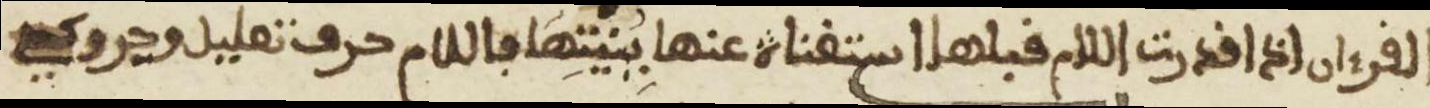القراءان اذا قدرت اللام قبلها استغنا ### عنها بنيتها فاللام حرف تعليل و جر و كي
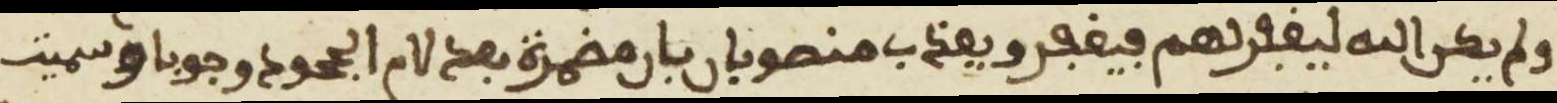و لم يكن الله ليغفر لهم فيغفر و يعذب منصوبان بان مضمرة بعد لام الجحود و جوبا و سميت
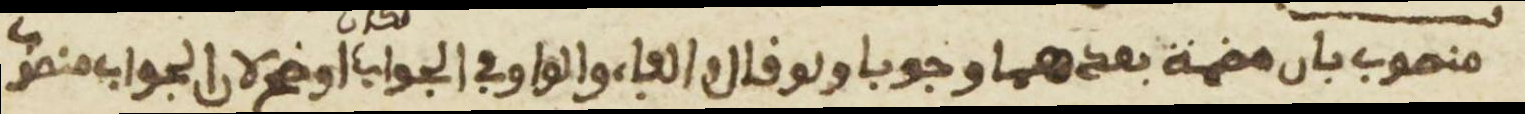منصوب بان ضمة بعدهما وجوبا و لو قال و الفاء و الواو في الجواب اوضح لان الجواب منصوب
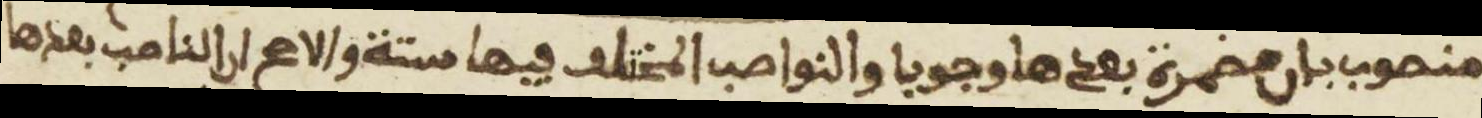منصوب بان مضمرة بعدها وجوبا و النواصب المختلف فيها ستة و الاصح ان الناصب بعدها
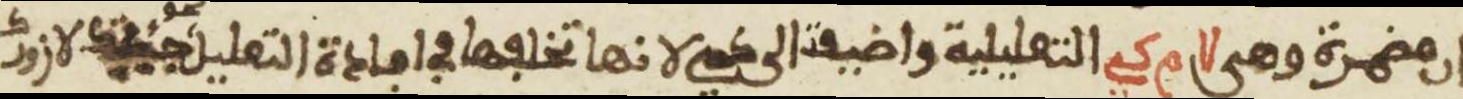ان مضمرة و هي لام كي التعليلية و اضيفت الى كي لانها تخلفها في افادة التعليل جئتك لازورك
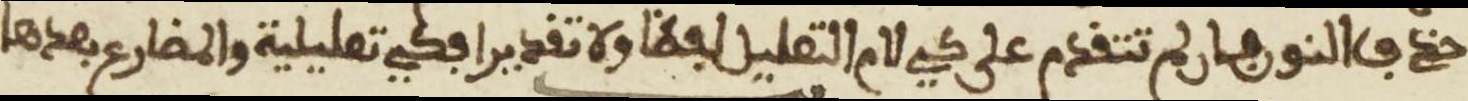حذف النون فان لم تتقدم على كي لام التعليل لفظا و لا تقديرا فكي تعليلية و المضارع بعدها
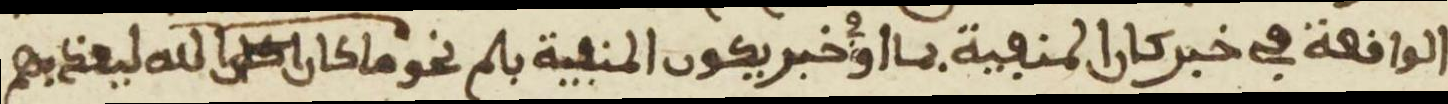الواقعة في خبر كان المنفية بما او خبر يكون المنفية بلم نحو ما كان الله ليعذبهم
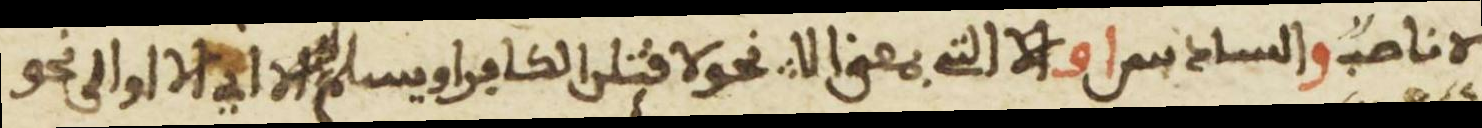لا ناصب و السادس او التي بمعنى الا نحو لاقتلن الكافر او يسلم اي الا او الى نحو
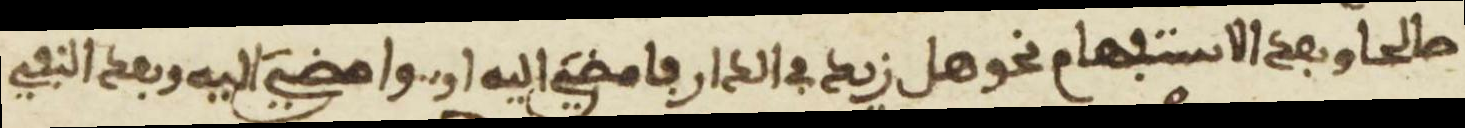صالحا و بعد الاستفهام نحو هل زيد في الدار فامضي اليه او و امضي اليه و بعد النفي
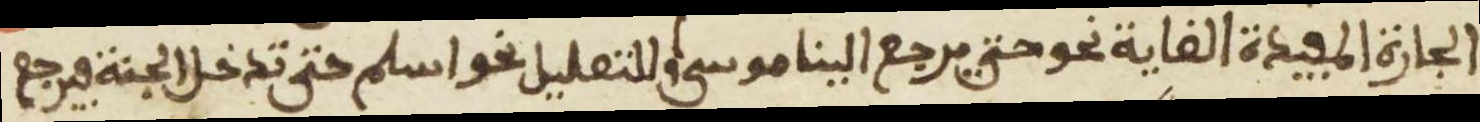الجارة المفيدة الغاية نحو حتى يرجع الينا موسى و التعليل نحو اسلم حتى تدخل الجنة فيرجع
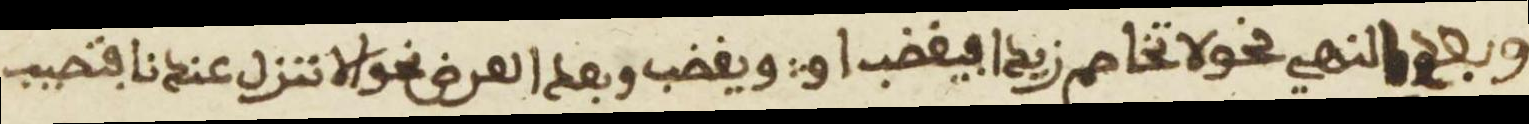و بعد النهي نحو لا تخاصم زيدا فيغضب او و يغضب و بعد العرض نحو الا ننزل عندنا فتصيب
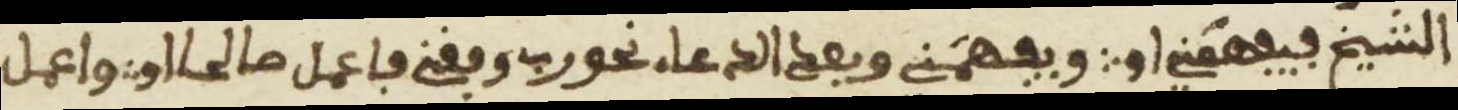الشيخ فيفهمني او و يفهمني و بعد الدعاء نحو رب وفقني فاعمل صالحا او و اعمل
